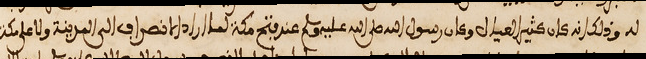له وذلك انه كان كثير العيال وكان رسول الله صلى الله عليه وسلم عند فتح مكة لما اراد الانصراف الى المدينة ولا مكة
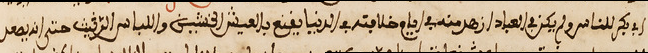ابى بكر للناس وولم يكن في العباد ازهر منه في ايام خلافته في الدنيا يقنع بالعيش الخشن واللباس الرّثيث حتى انه يصعد
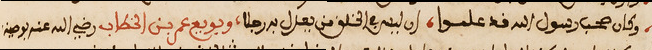وكان صحب رسول الله قد علموا ان ليس في الخلق من يعدل به رجلا وبويع عمر بن الخطاب رضي الله عنه بوصية
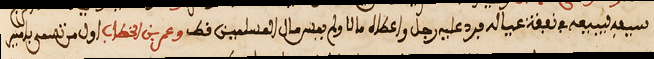سيفه ليبيعه في نفقة عياله فره عليه رجل واعطاه ما لا ولم يمس مال المسلمين قط وعمر بن الخطاب اول من تسمى بامير
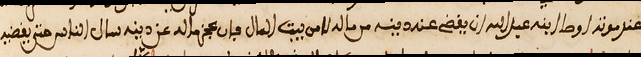عند موته اوصا ابنه عب الله ان يقضى عنه دينه من ماله لا من بيت المال فان عجز ماله عن دينه سال الناس حتى يقضيه
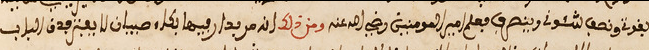بقوتى ونصف شئونى وينصرف فعلم امير المومنين رضي الله عنه ومن ذلك انه مر بدار بكاء صبيان لا يفتر فدق الباب
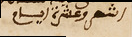اشهر وعشرة ايما
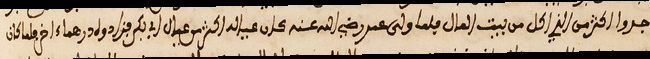جدوا اكثر من الذي اكل من بيت المال فلما ولى عمر رضي الله عنه كان عياله اكثر من عيال ابى بكر فزادوه درهما ءاخر فلما كان
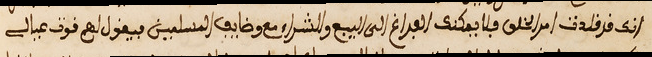انك قد قلدت امر الخلق فلا يمكنك الفراغ الى البيع والشراء مع وضايف المسلمين فيقول لهم قوت عيالى
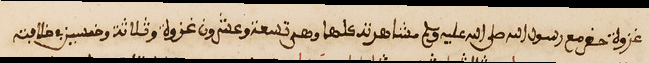غزوة حضر مع رسول الله صلى الله عليه وسلم مشاهدته كلها وهى تسعة وعشرون غزوة وثلاثة وخمسين في خلافته
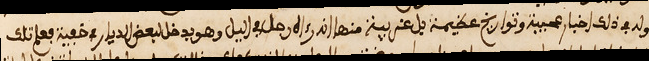وله في ذلك اخبار عجيبة وتواريخ عظيمة بل غريبة منها انه رءاه رجل في اليل وهو يدخل لبعض الديار في خفية فعلم تلك
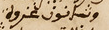وثمانون غزوة
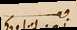قف
